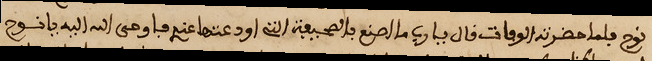نوح فلما حضرته الوفات قال يارب ما اصنع بالصحيفة التي او دعتها عندى فاوحى الله اليه يا نوح
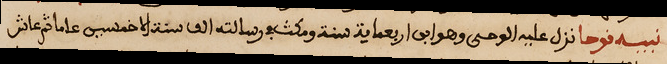نبيه نوحا نزل عليه الوحى وهوابن اربعماية سنة ومكث في رسالته الف سنة الا خمسين عاما ثم عاشر
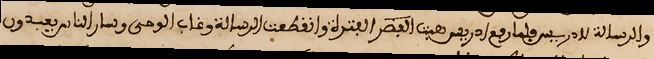والرسالة لاريس فلما رفع ادريس هبت الفضر الفترة وانقطعت الرسالة وغاب الوحى وسار الناس يعبدون
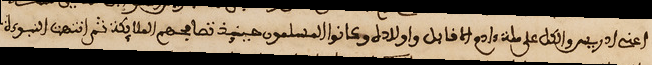اعنى ادريس ولكل على ملة ءادم الاقابل وأولاده وكانوا المسلمون حينئذ تصافحعم الملائكة ثم انتهت النبوءة
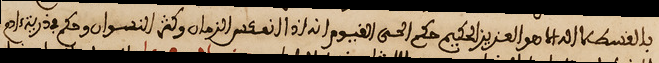بالقسط لا اله الا هو لعزيز الحكيم حكم الحى القيوم انه اذا انعكس الزمان وكثر النسوان وحكم في ذرية ءادم
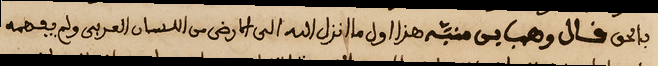بالحق قال وهب بن منبه هذا اول ما انزل الله الى الارض من اللسان العربى ولم يفهمه
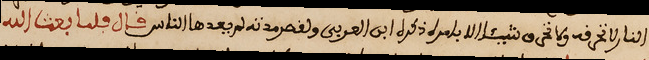النار لاتحرقه ولا تحرق شيئا الا بامره ذكره ابن العربى ولقصر مدته لم يعدها الناس قال فلما بعث الله
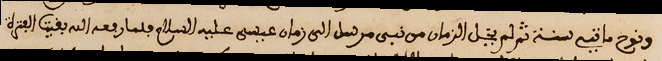ونوح مايتى سنة ثم لم يخل الزمان من نبى مرسل الى زمان عيسى عليه السلام فلما رفعه الله بقيت الفترة
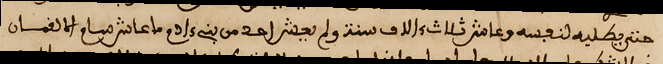حتى يطلبه لنفسه وعاش ثلاث ءالاف سنة ولم يعش احد من بنى ءادم ما عاش سام الا لقمان
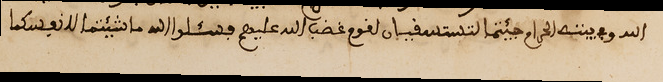الله وفي بيته الحرام جيتما لتستسقيان لقوم غضب الله عليهم فسئلوا الله ما شيتما لا نفسكما
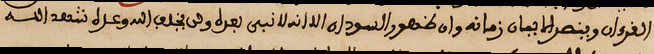القرءان وينصر الايمان زمانه وان ظهور السودان الا انه لا نبى بعده ولن يخلف الله وعده شهد الله
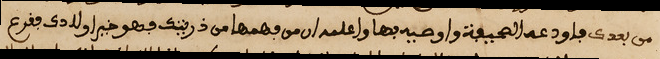من بعدك فاودعه الصحيفة واوصيه فها واعلمه ان من فهمها من ذريتك فهو خير اولادك فقرع
